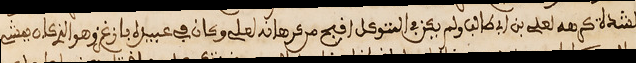لشدة كرهه لعلى بن ابى طالب ولم يكن في المتوكل اقبح من كرهانه لعلى وكان في عبيده بازغز وهو الذي كان يمشى
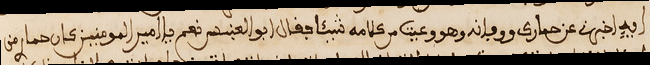ايه اخبرنى عن حمارك ووفانه وهو وعيت من كلامه شئا فقال ابو العنبس نعم يا امير المومنين كان حمارى من
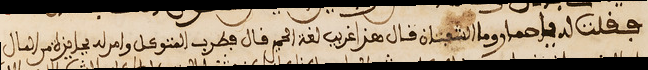فقلت له يا حمار وما الشفتان قال هذا غريب لغة الحمير قال فطرب المتوكل وامر له يحايذة من المال
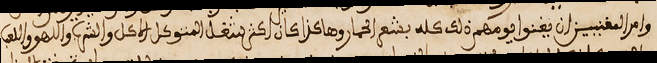وامر المغنيين ان يغنوا يومهم ذلك كله بشعر الحمار وهاكذا كان اكثر شغل المتوكل الاكل والشرب واللهو واللعب
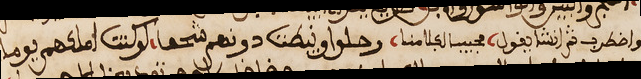واضطرب ثم انشا يقول مجيبا لكلا منا رحلوا وينطت دونهم شحما لو كتت املكهم يوما
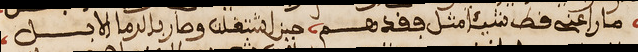مارا عنه قط شئا مثل فقد هم جبن اشتغلت وصار بالرما الابل
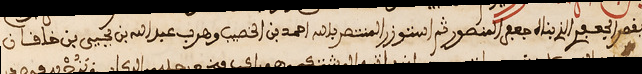بقصر الجعفرى الذي بناه جعفر المنصور ثم استوزر المنتصر بالله احمد بن الخصيب وهرب عبد الله بن يحيى بن خاقان
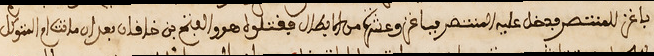باغز للمنتصر فدخل عليه المنتصر فباغز وعشرة من الا بطال فقتلوه هو والفتم بن خاقان بعد ان ماتت ام المتوكل
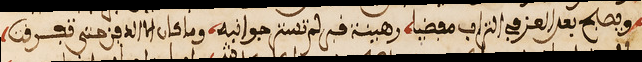ويصبح بعد العز في التراب مفضيا رهينة قبر لم تستر جوانبه وما كان الا الدفن حتى تفرقت
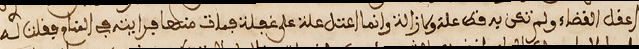اعقل القضاء ولم تكن به قط علة ولا زالة وانما اعتل علة على غفلة فمات منها فرايته في المنام فقلت له
